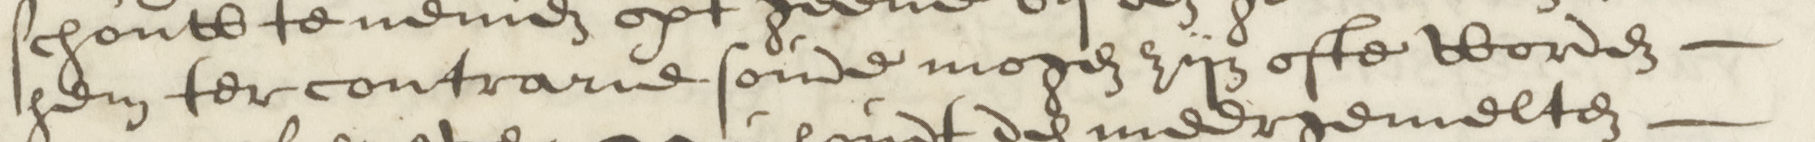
hem ter contrarie soude mogen zjin ofte worden —
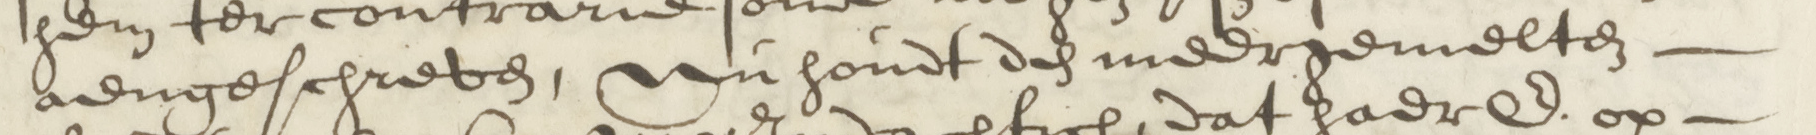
aengeschreven, Nu houdt de meergemelten —
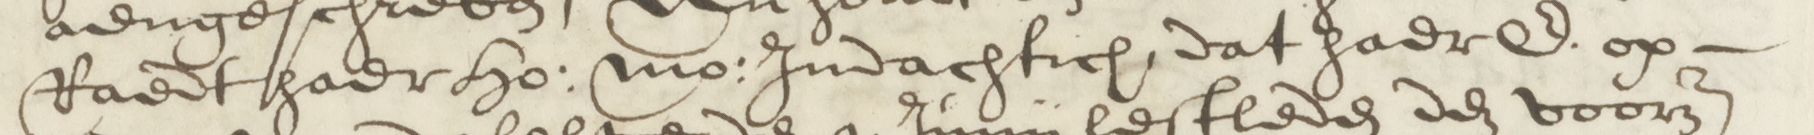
Raedt haer Ho:Mo: indachtich, dat haer E. op —
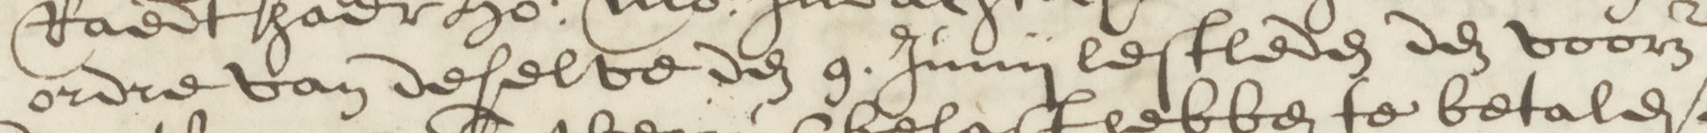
ordre van deselve den 9. Junij lestleden den voorn
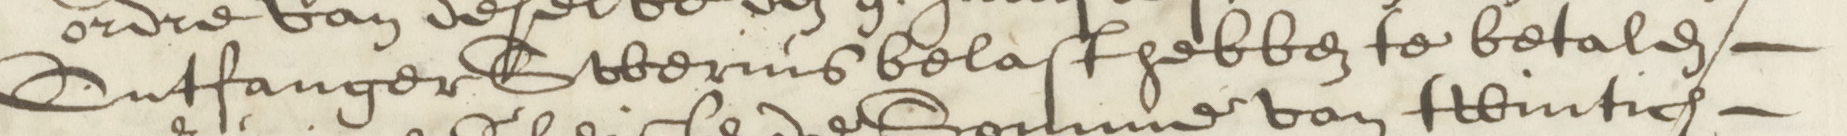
Ontfanger Swerius belast hebben te betalen —
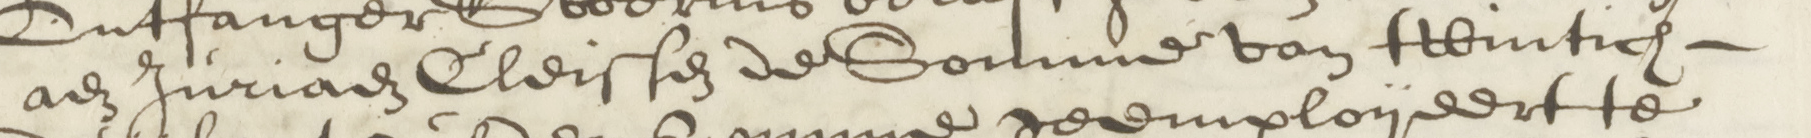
aen Juriaen Cleissen de Somme van twintich —
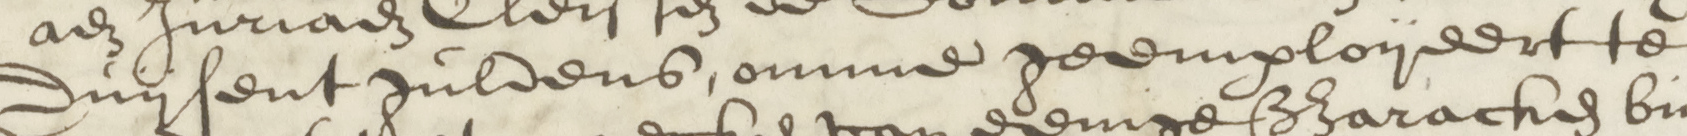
Duysent guldens, omme geemploijeert te
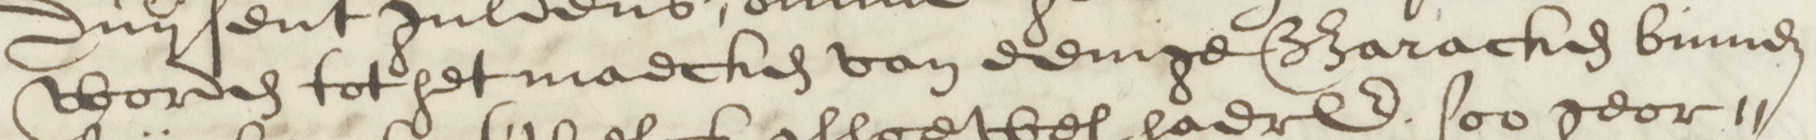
worden tot het maecken van eenige Baracken binnen
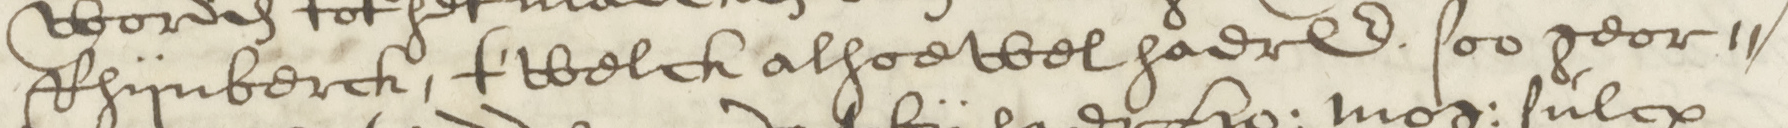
Rhijnberck, t'welck alhoewel haer E. soo geor„
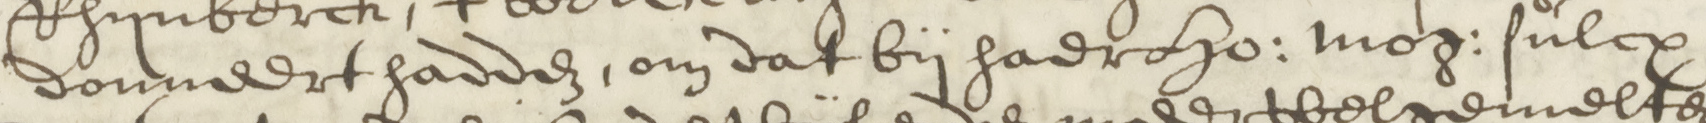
donneert hadden, om dat bij haer Ho:Mo: sulcx
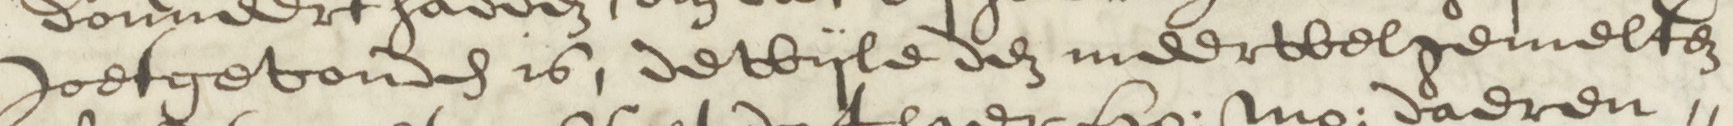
goetgevonden is, dewijle den meerwelgemelten
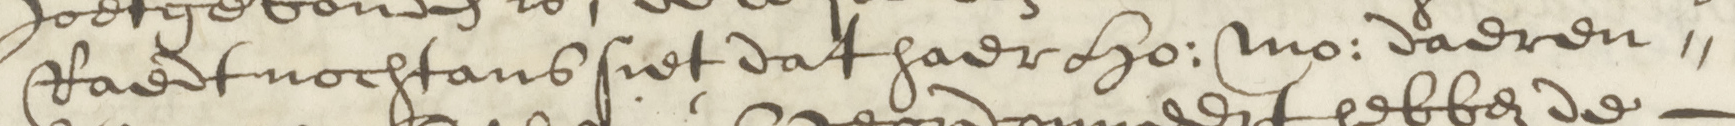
Raedt nochtans siet dat haer Ho:Mo: daeren„
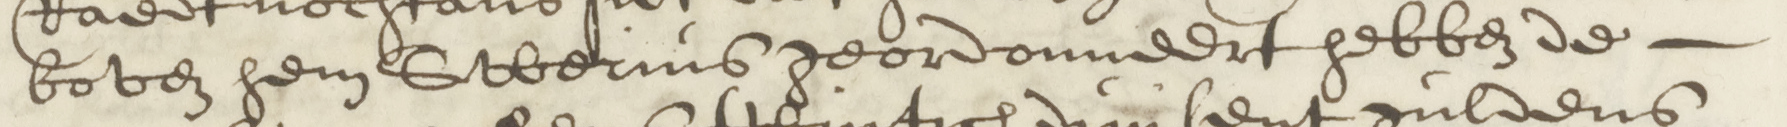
boven hem Swerius geordonneert hebben de —
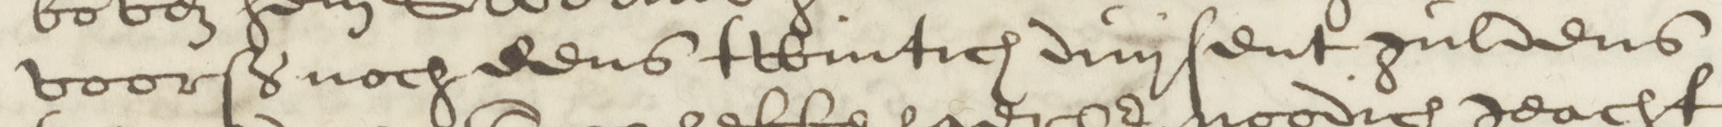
voorsz noch eens twintich duijsent guldens
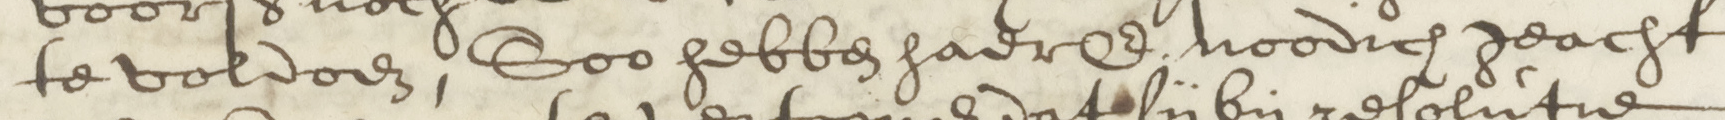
te voldoen, Soo hebben haer E. noodich geacht
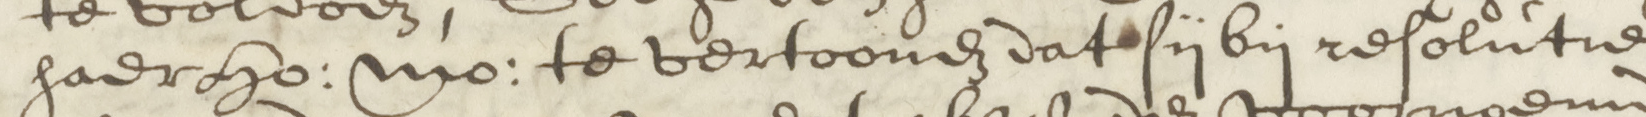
haer Ho:Mo: te vertoonen dat sij bij resolutie
